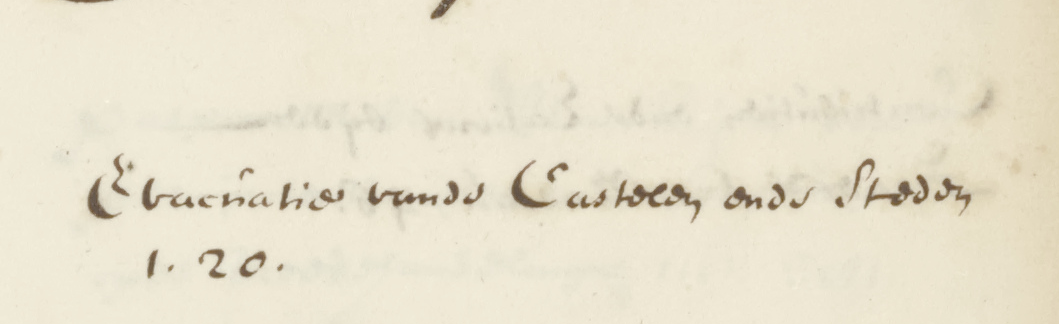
Evacuatie vande Castelen ende Steden
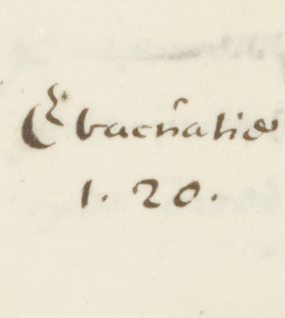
1. 20.
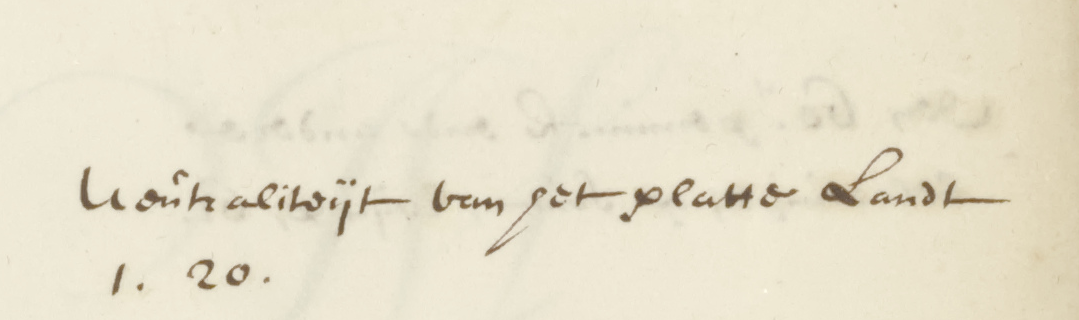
Neutraliteijt van het platte Landt
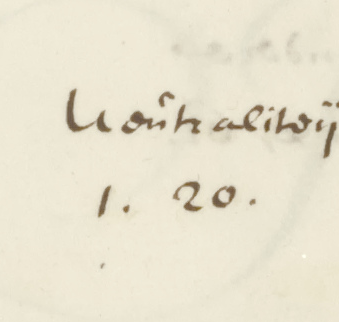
1. 20.
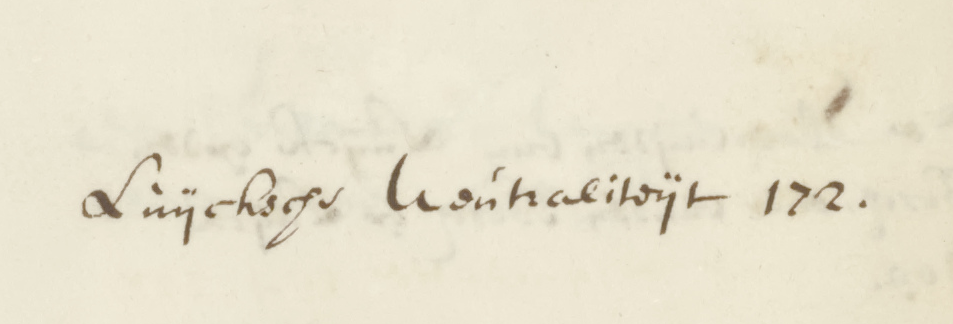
Luijcksche Neutraliteijt 172.
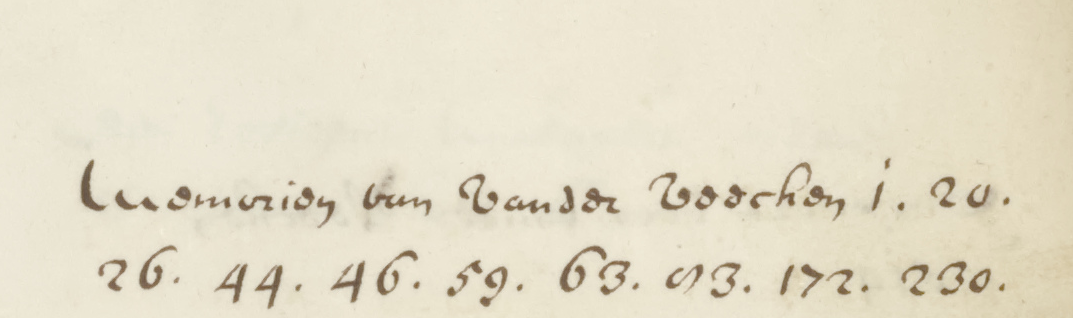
Memorien van Vander Veecken 1. 20.
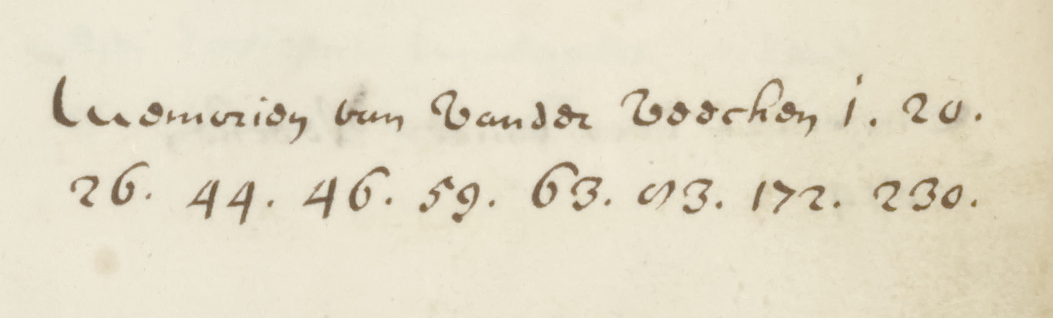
26. 44. 46. 59. 63. 83. 172. 230.
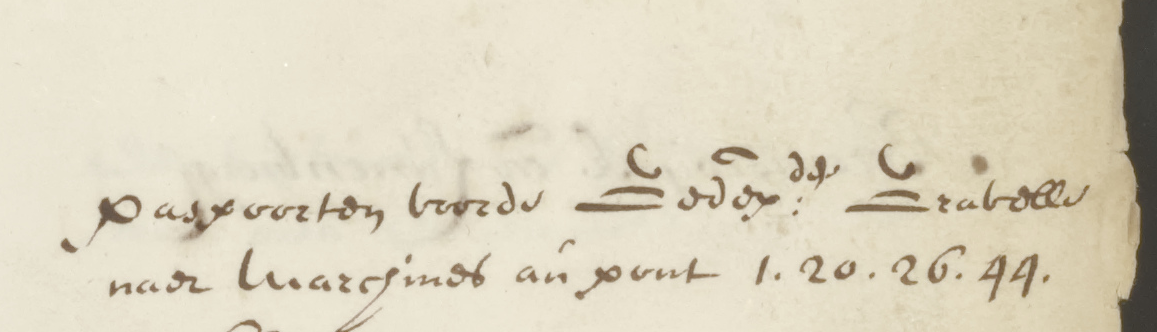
Paspoorten voorde Gedepde: Gravelle
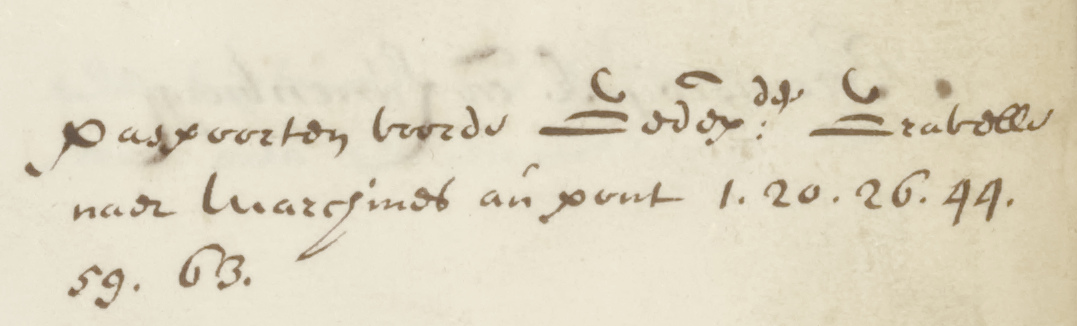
naer Marchines au pont 1. 20. 26. 44.
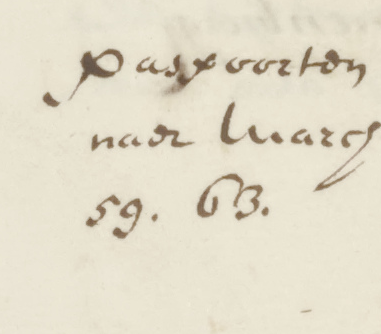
59. 63.
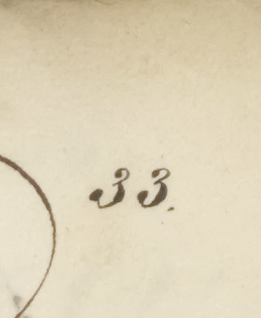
33
